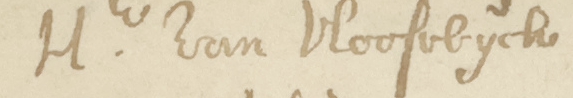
Hr. van Vlooswijck
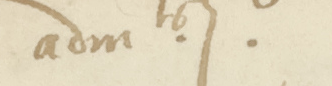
admts.hr.
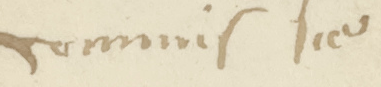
commissie
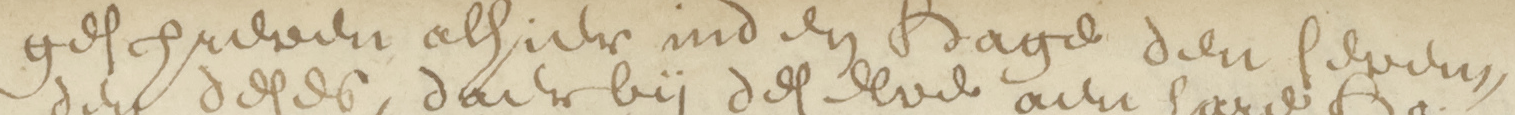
geschreven alhier inden Hage den seven„
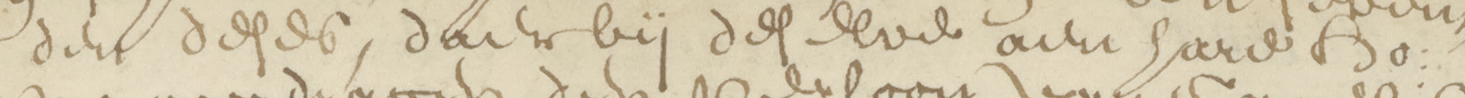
den deses, daer bij deselve aen hare Ho:
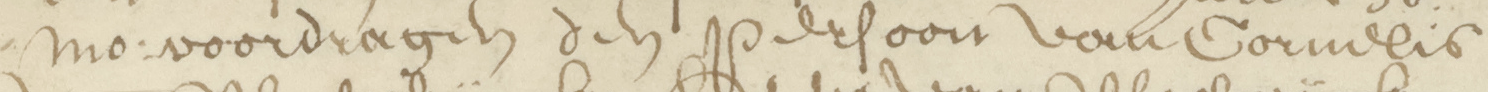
Mo: voordragen den persoon van Cornelis
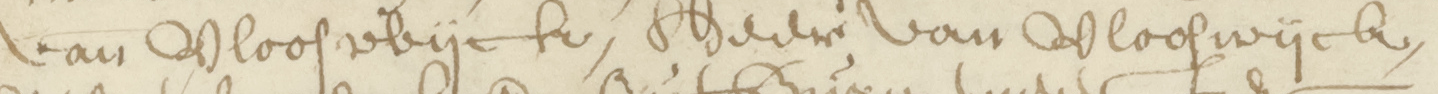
van Vlooswijck, heer van Vlooswijck,
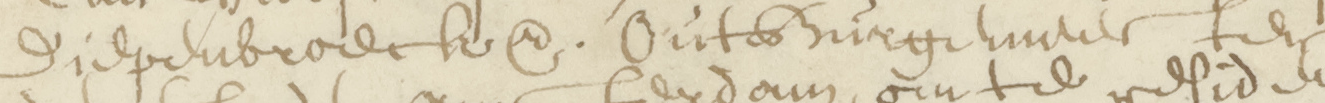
Diepenbroeck & OutBurgemeester
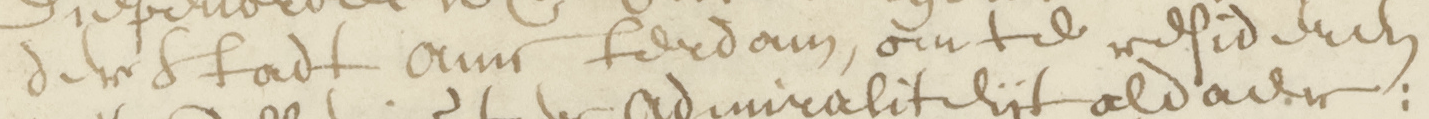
der Stadt Amsterdam, om te resideren
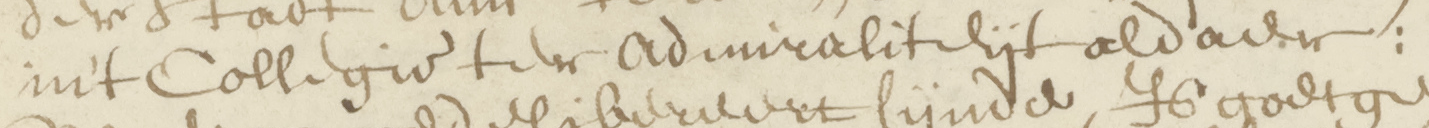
in't Collegie ter Admiraliteijt aldaer:
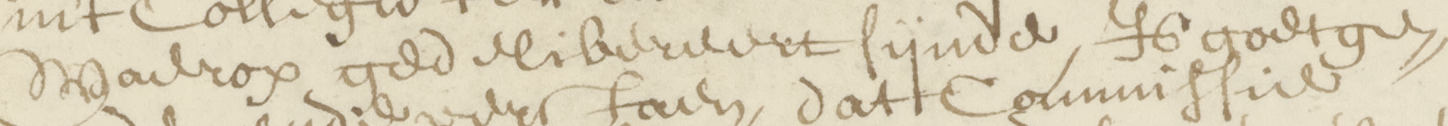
Waerop gedelibereert sijnde, Is goetge„
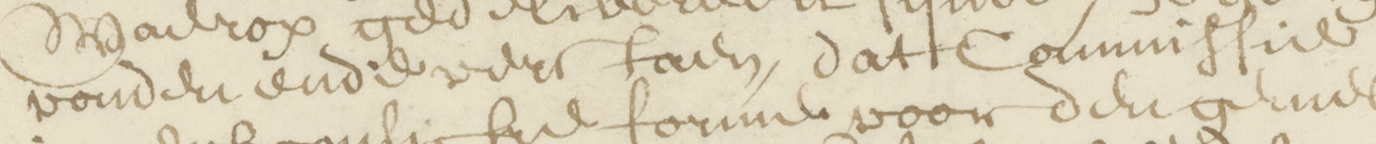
vonden ende verstaen, dat Commissie
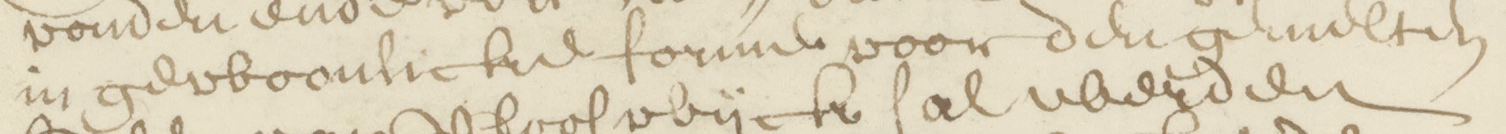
in gewoonlicke forme voor den gemelten
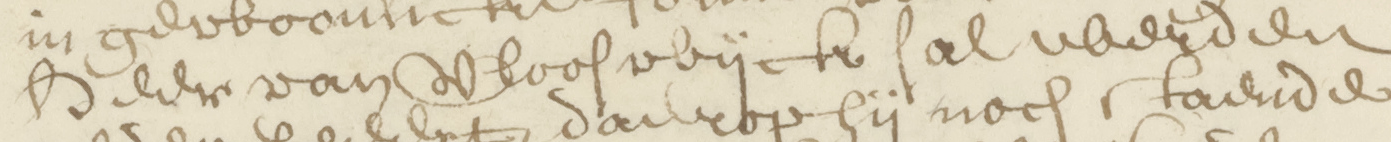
Heer van Vlooswijck sal werden
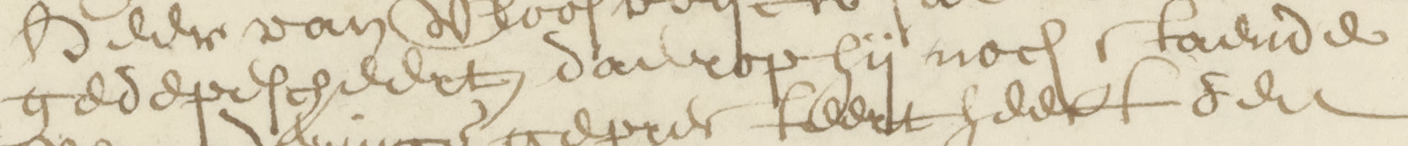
gedepescheert, daerop hij noch staende
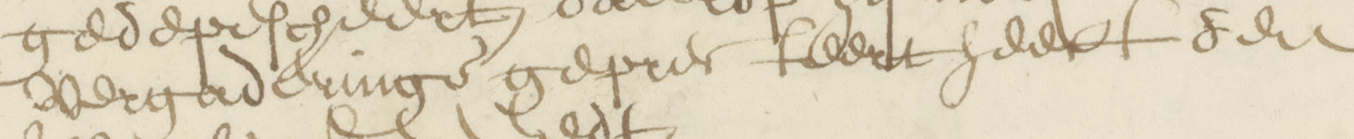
Vergaderinge gepresteert heeft den
